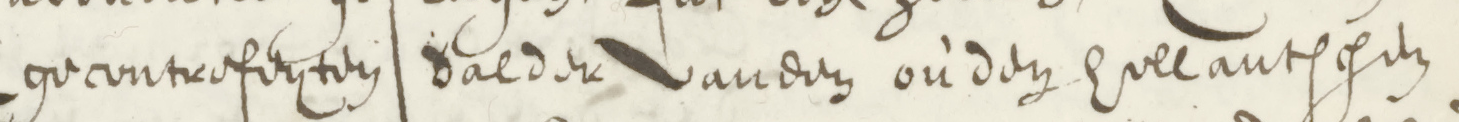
geconterfeyten dalder vanden ouden hollantschen
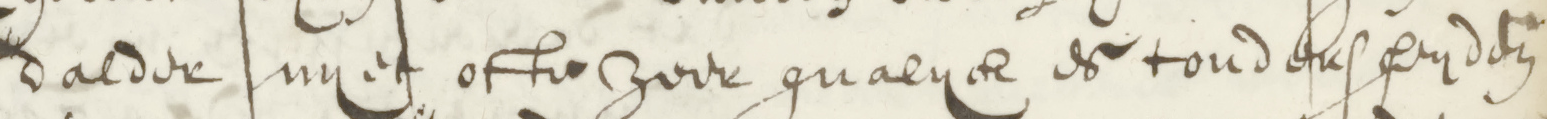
dalder nyet ofte zeer qualyck es t'onderscheyden
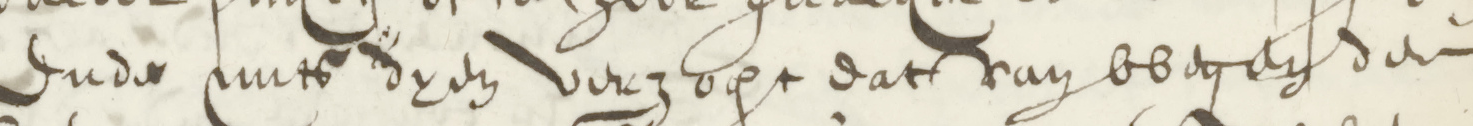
Ende mits dyen verzocht dat van wegen der
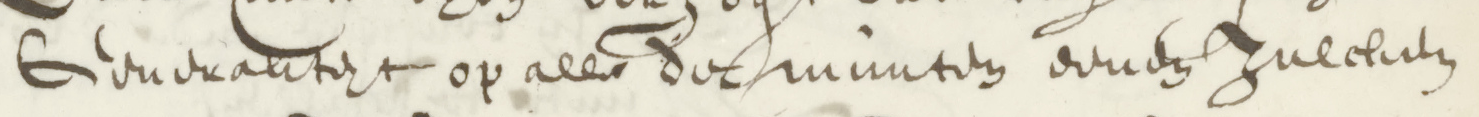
Generaliteyt op alle der munten eenen zulcken
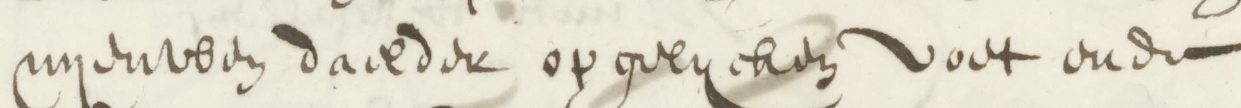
nyeuwen daelder op gelycken voet ende
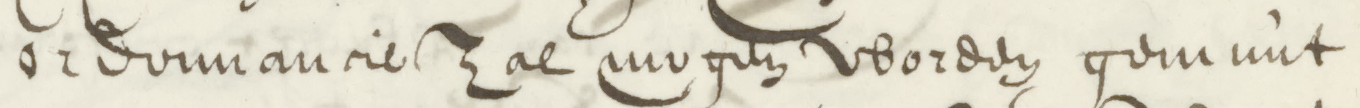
ordonnancie zal mogen worden gemunt
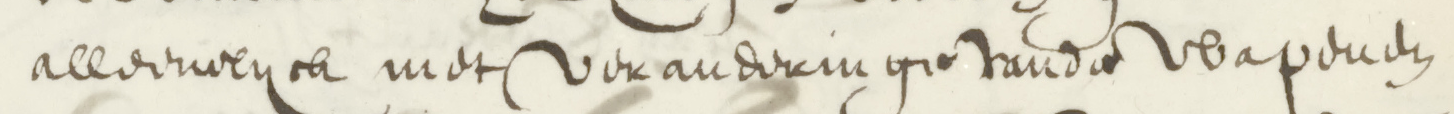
alleenelyck met veranderinge vande wapenen
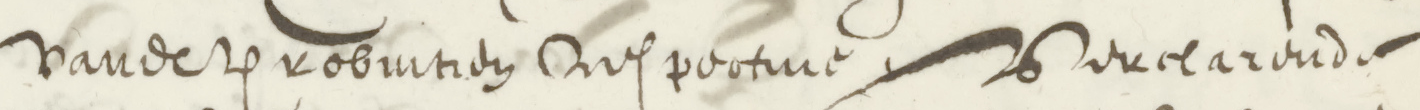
vande provintien respective. Verclarende
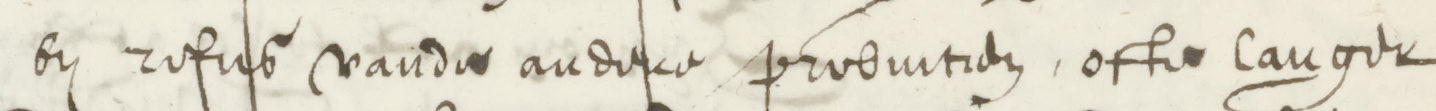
bij refus vande andere provintien ofte langer
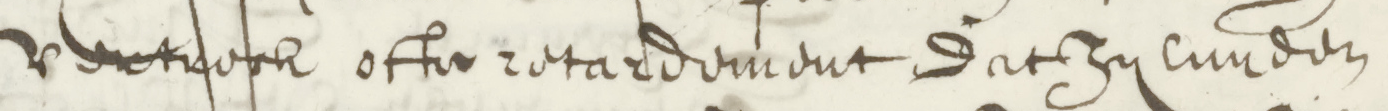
vertreck ofte retardement dat zy luyden
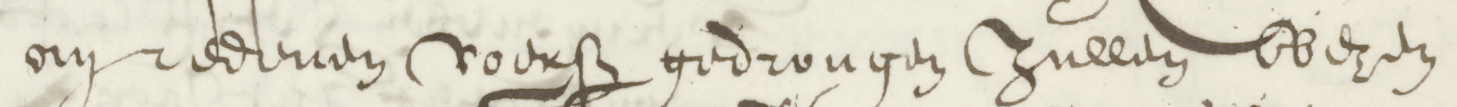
om redenen voers gedrongen zullen wezen
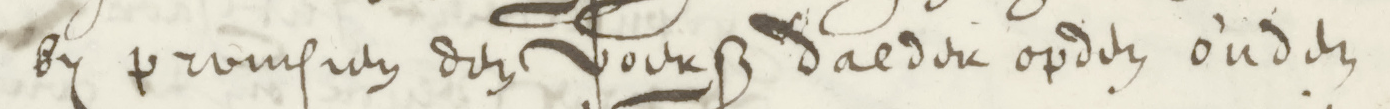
bij prouisien den voers dalder opden ouden
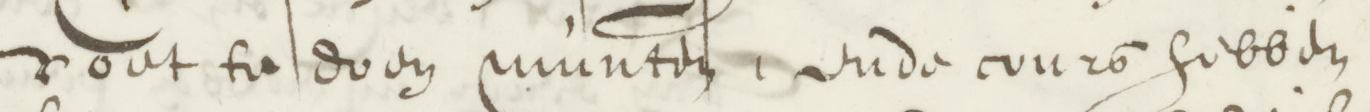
voet te doen munten, ende cours hebben
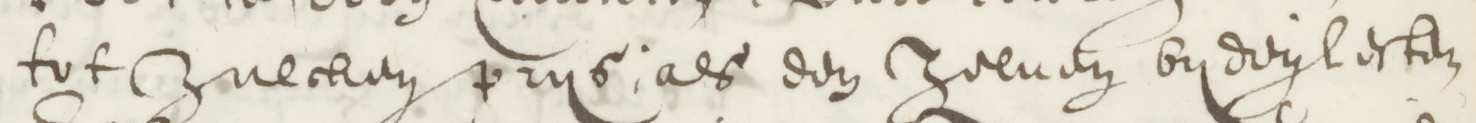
tot zulcken prys als den zelven by den lesten
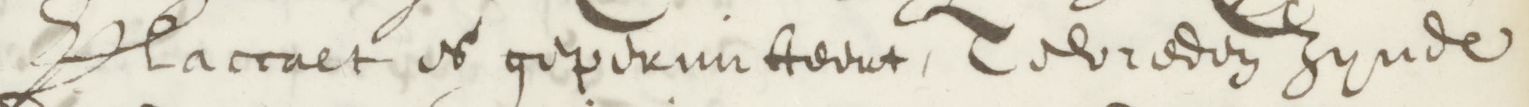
Placcaet es gepermitteert. Tevreden zynde
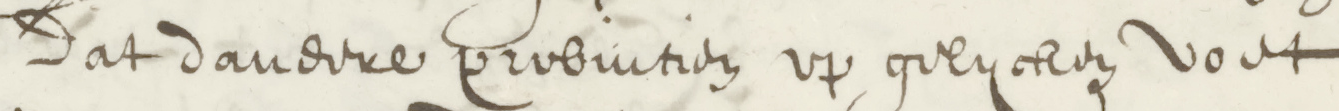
dat d'andere provintien op gelycken voet
